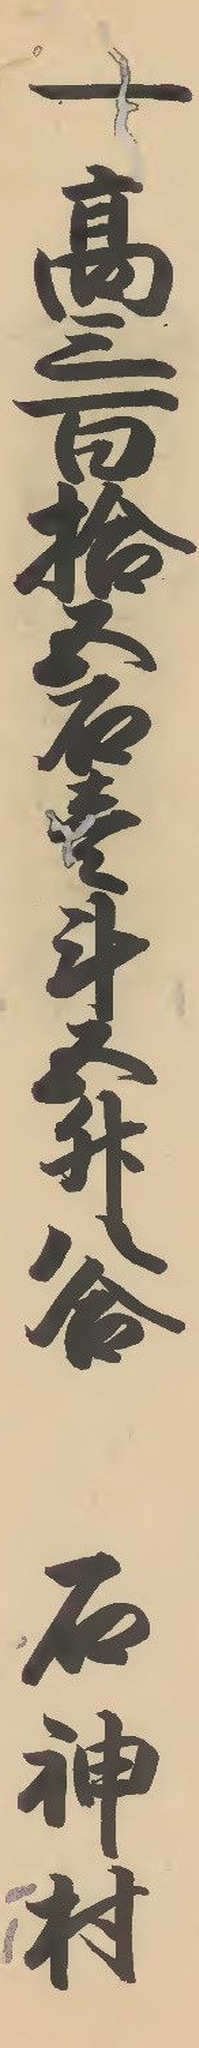一高三百拾五石壱斗五升八合石神村
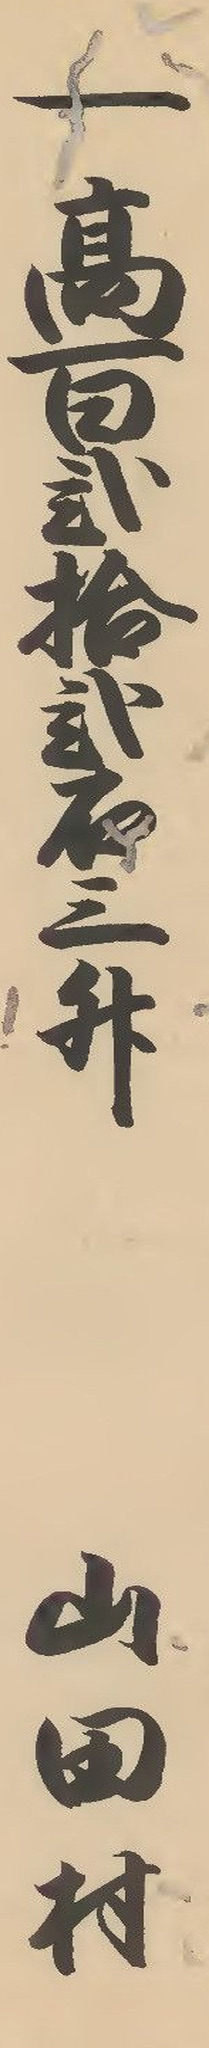一高百弐拾弐石三升山田村
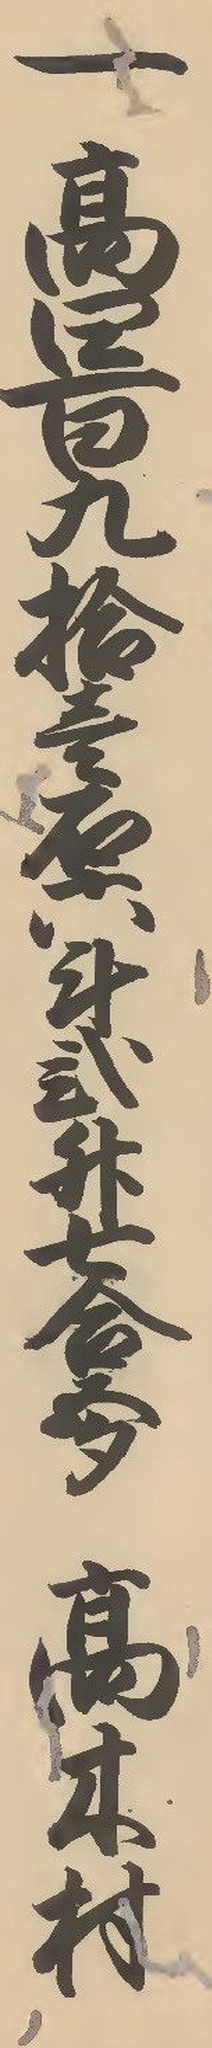一高四百九拾壱石六斗弐升七合五勺高木村
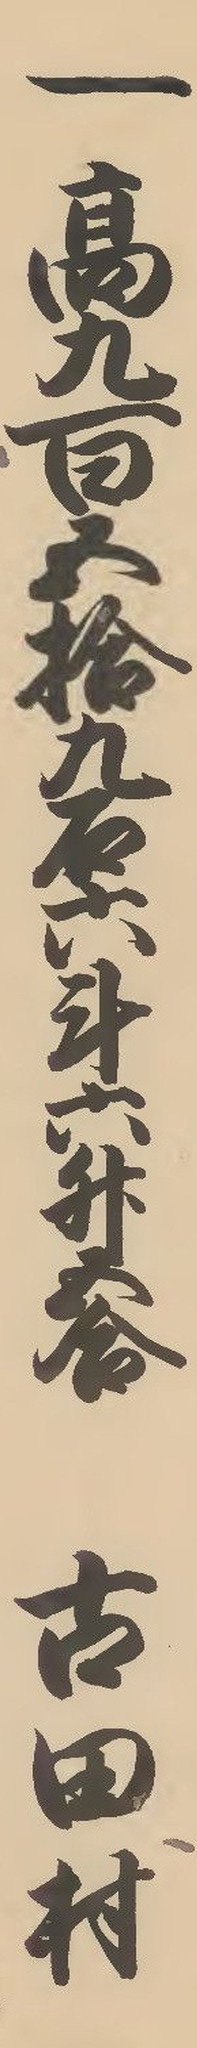一高九百五拾九石六斗六升五合古田村
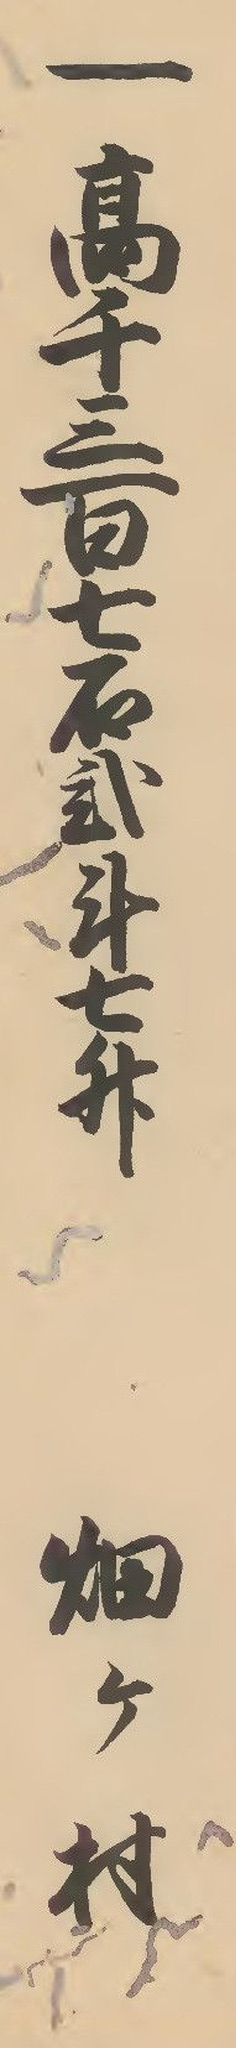一高千三百七石弐斗七升畑ヶ村

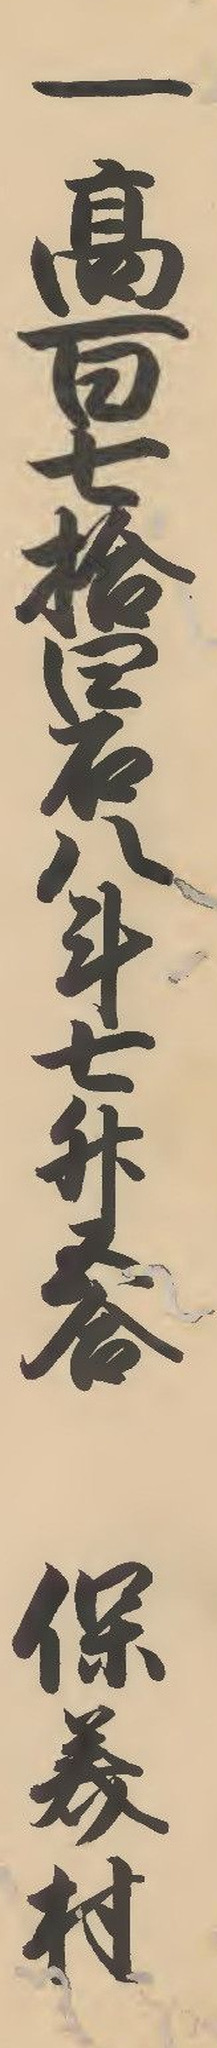一高百七拾四石八斗七升五合保美村
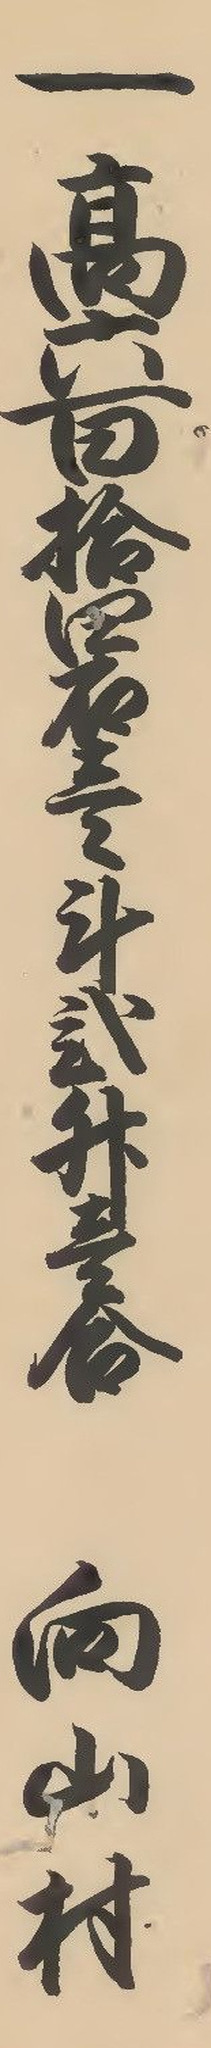一高六百拾四石壱斗弐升壱合向山村
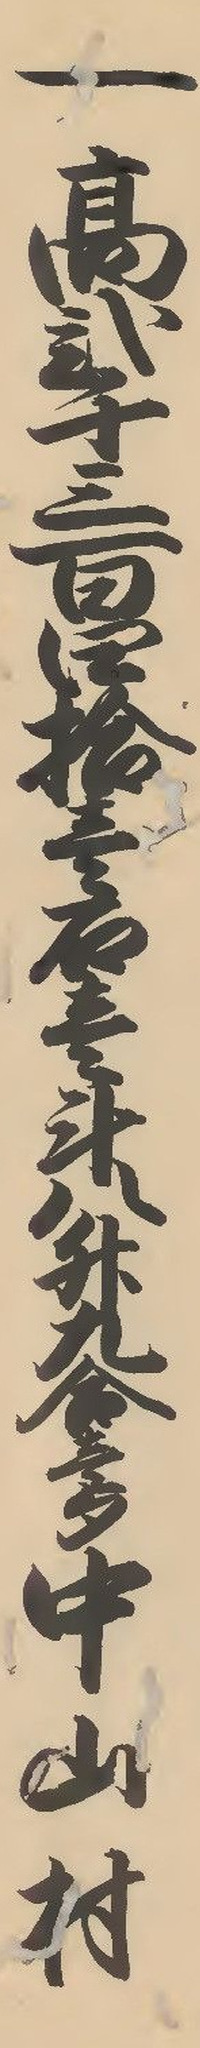一高弐千三百四拾壱石壱斗八升九合壱勺中山村
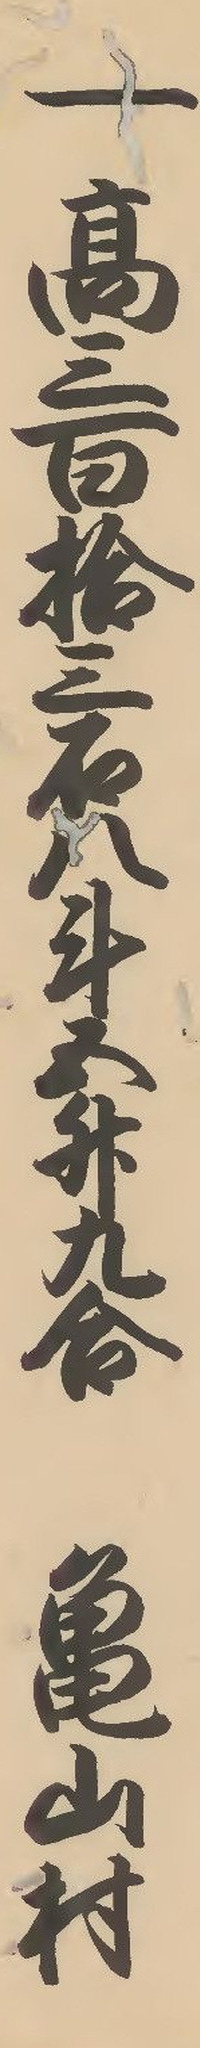一高三百拾三石八斗五升九合亀山村
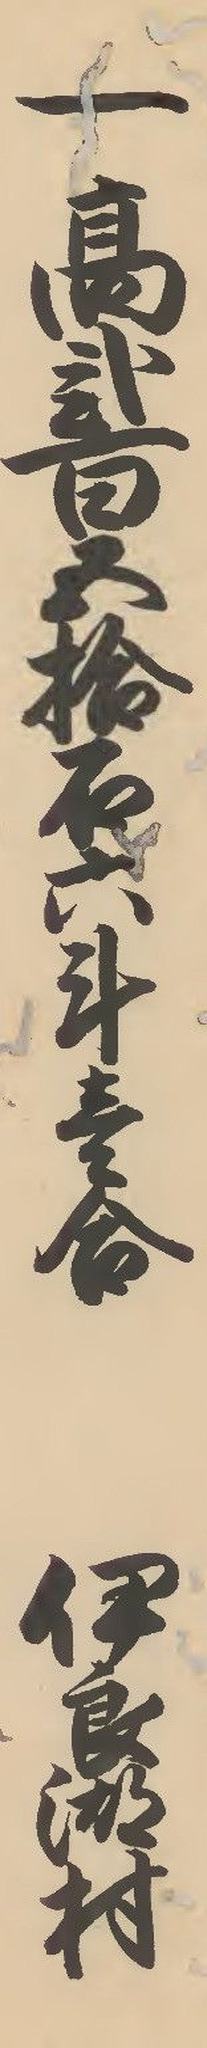一高弐百五拾石六斗壱合伊良湖村
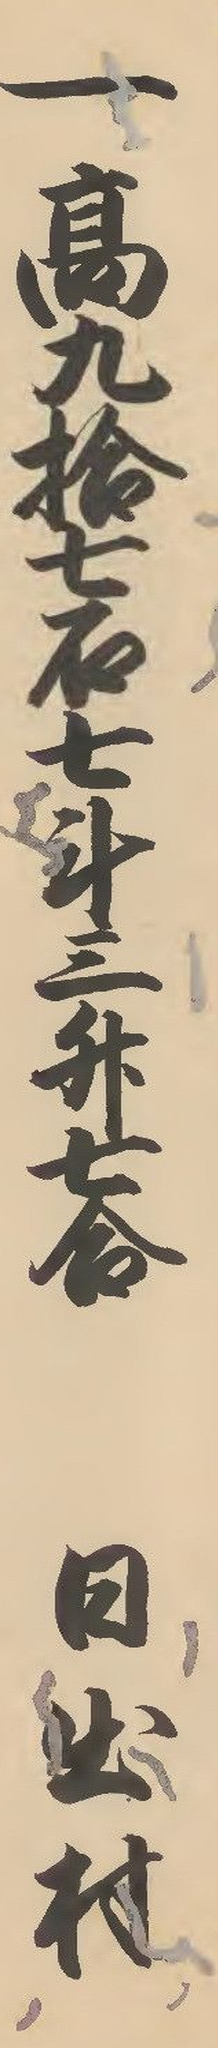一高九拾七石七斗三升七合日出村
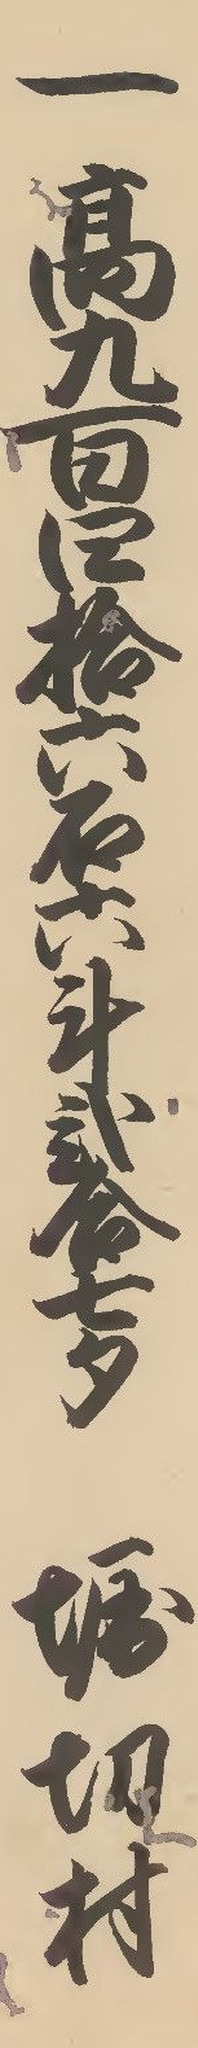一高九百四拾六石六斗弐合七勺堀切村
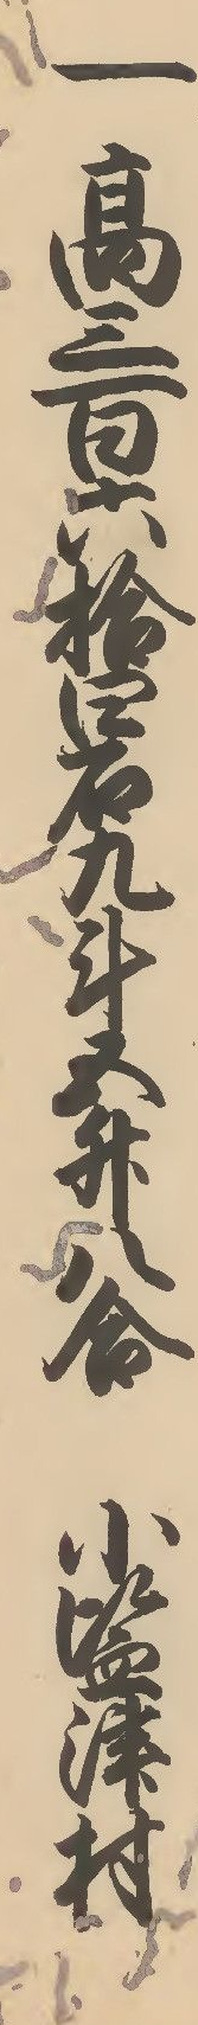一高三百六拾四石九斗五升八合小塩津村

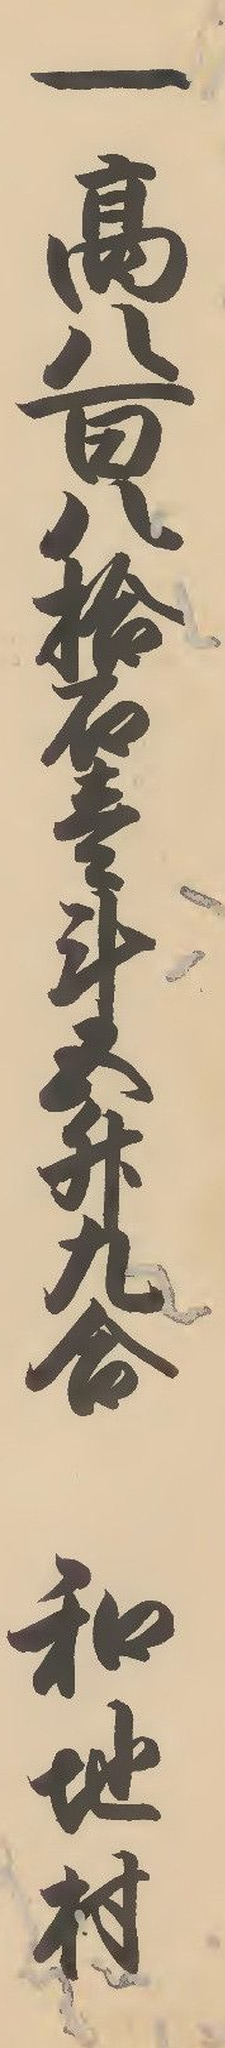一高八百八拾石壱斗五升九合和地村
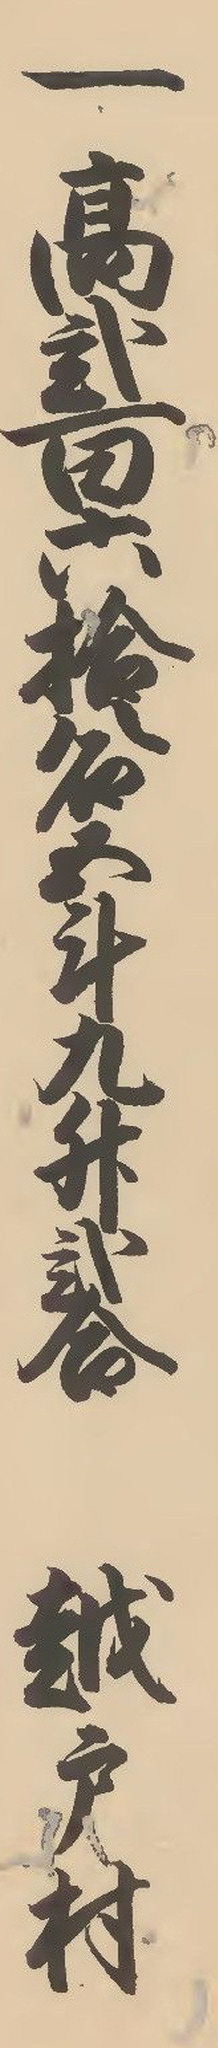一高弐百六拾八石五斗九升弐合越戸村
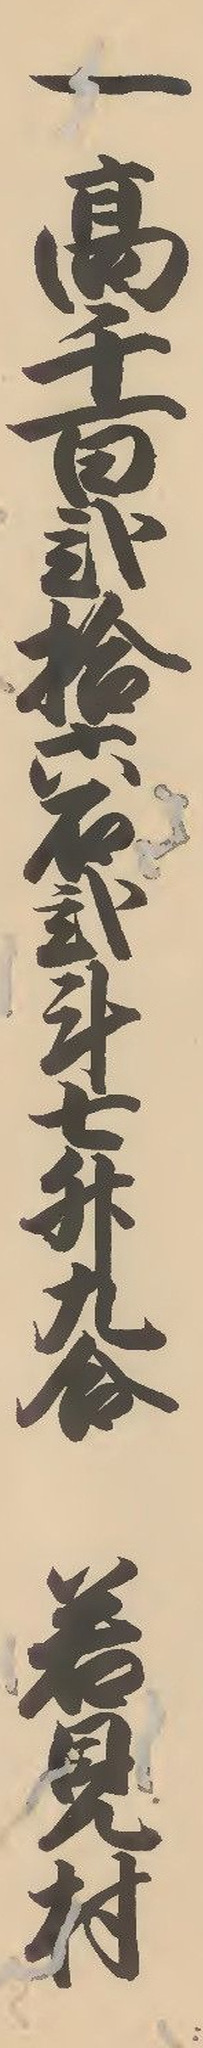一高千百弐拾六石弐斗七升九合若見村
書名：三河国郷帳
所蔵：国立公文書館 National Archives of Japan
